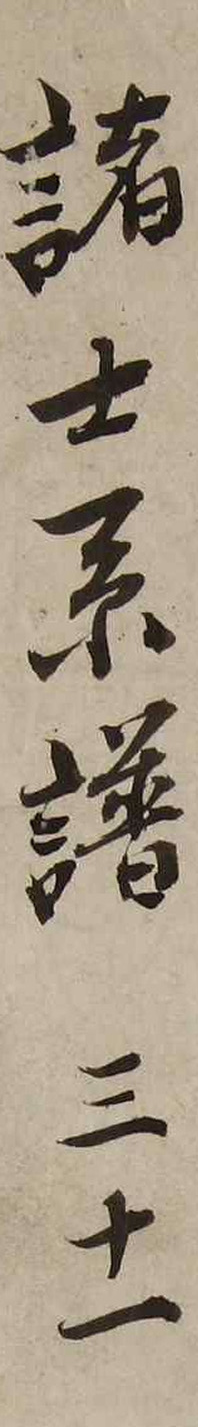諸士系譜三十一

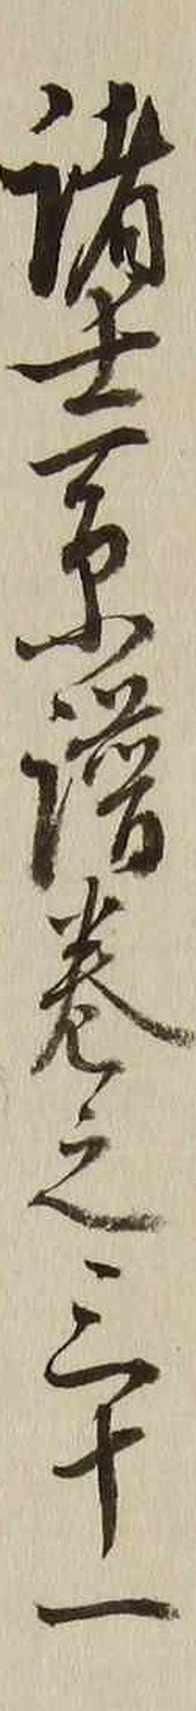諸士系譜巻之三十一
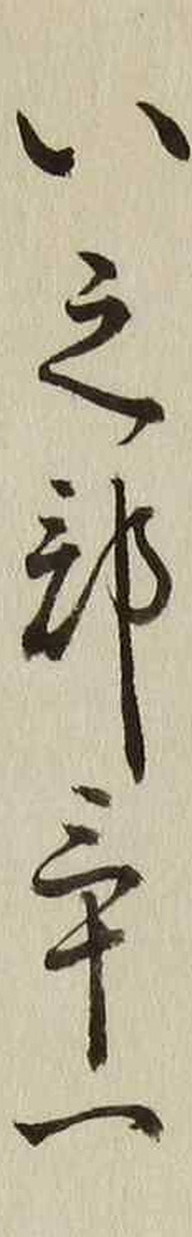い之部三十一
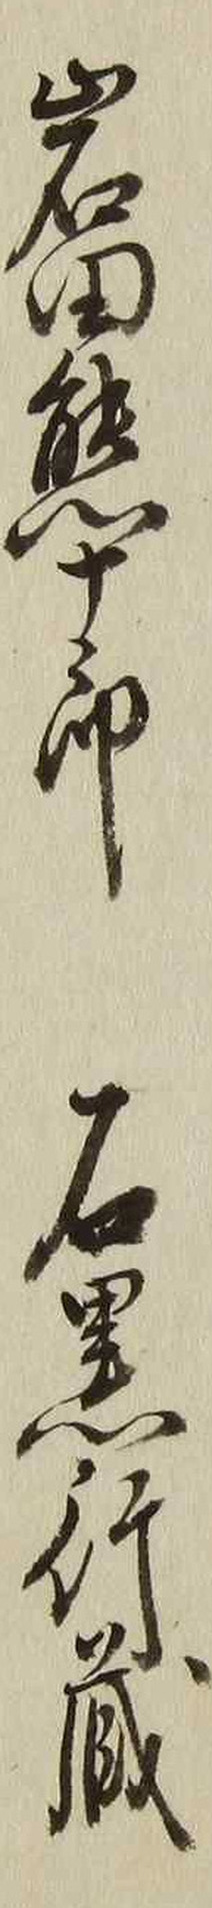岩田熊十郎石黒行蔵
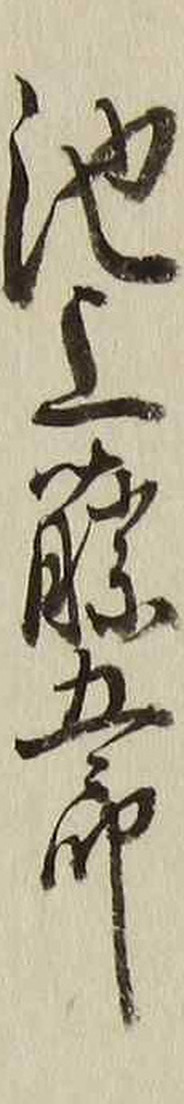池上藤五郎

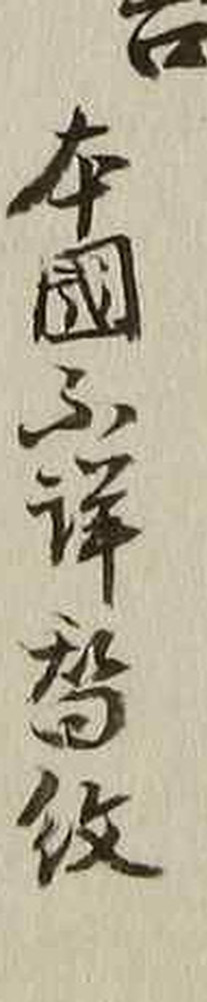本国不詳替紋
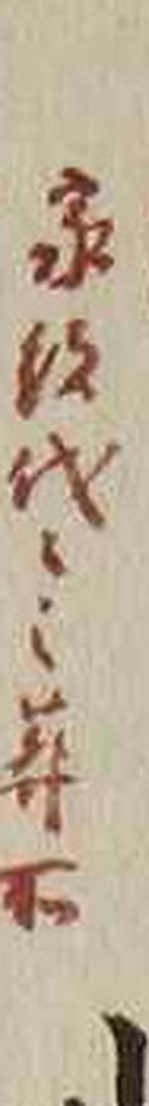家紋代々之葬所
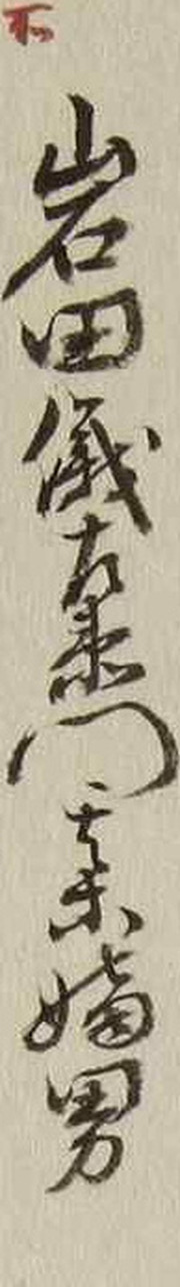岩田儀左衛門某嫡男
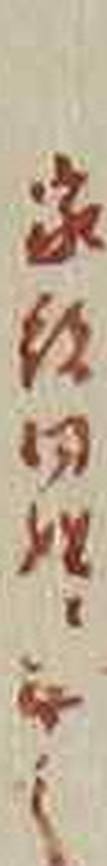家紋同姓ニ無之
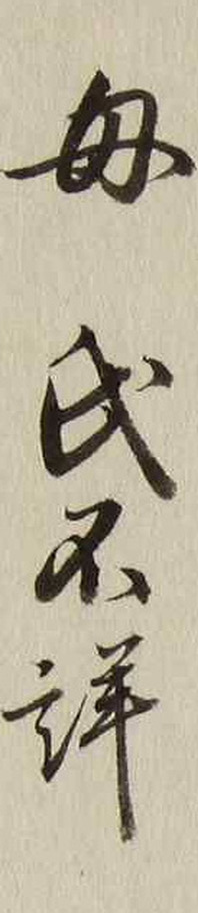母氏不詳
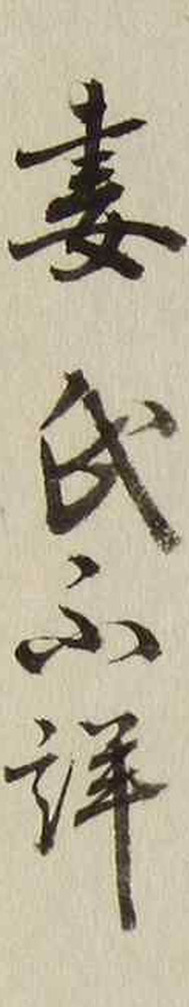妻氏不詳
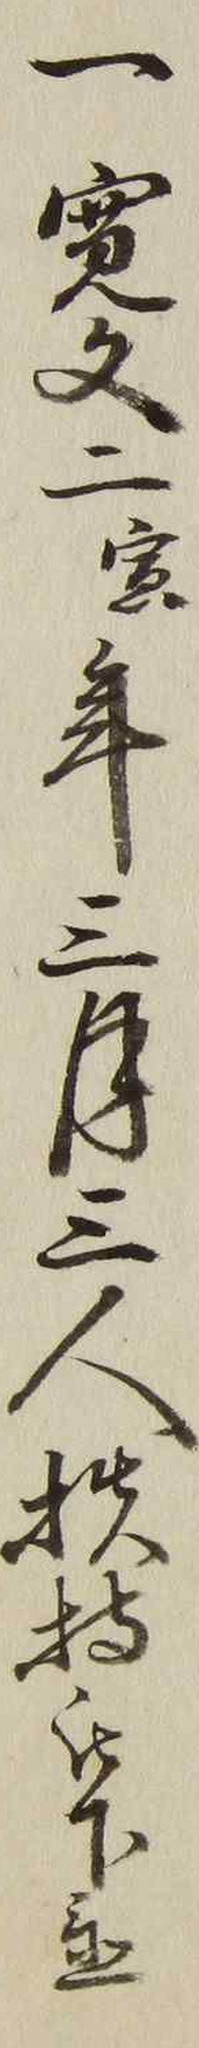一寛文二寅年三月三人扶持被下置

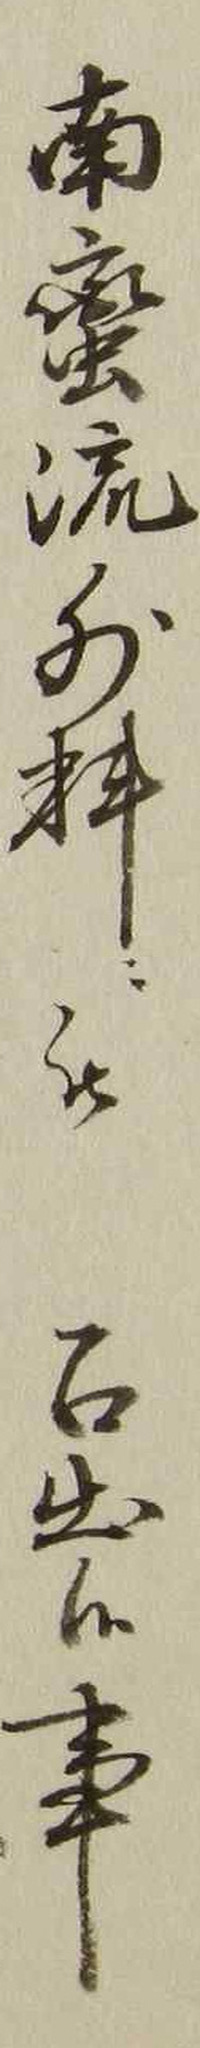南蛮流外ニ被召出候事
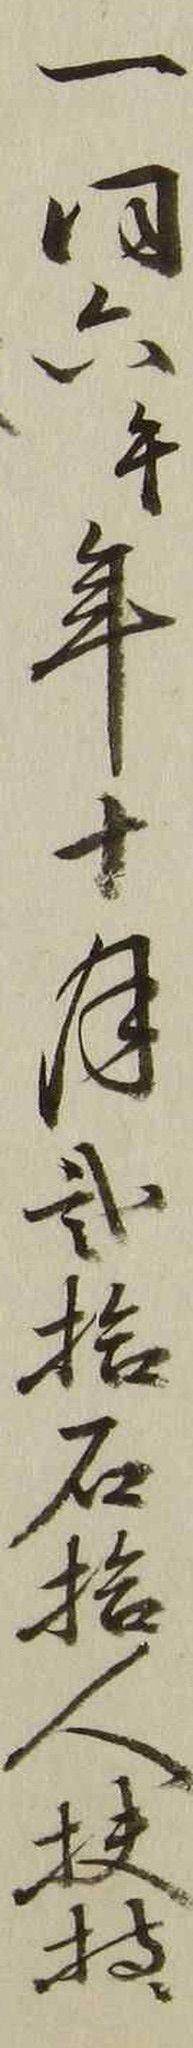一同六午年十月弐拾石拾人扶持
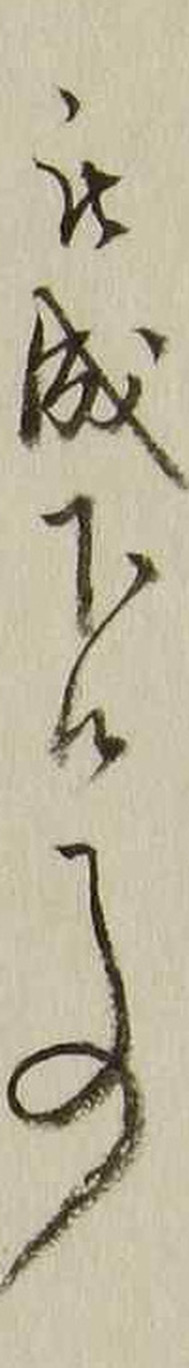被成下候事
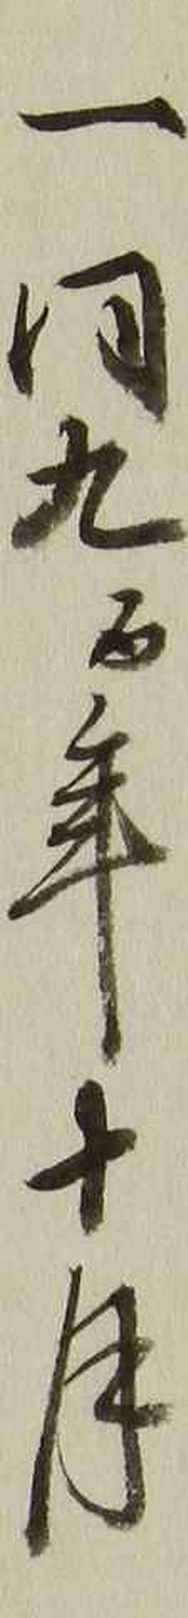一同九酉年十月
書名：諸士系譜　巻之31　い之部31
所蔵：会津若松市立会津図書館
